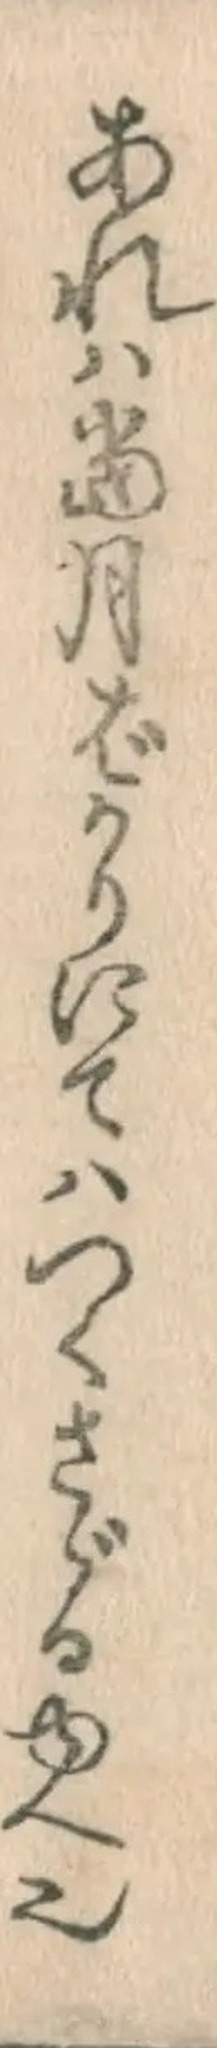あれは当月ばかりにてはつくさゞるゆへ也
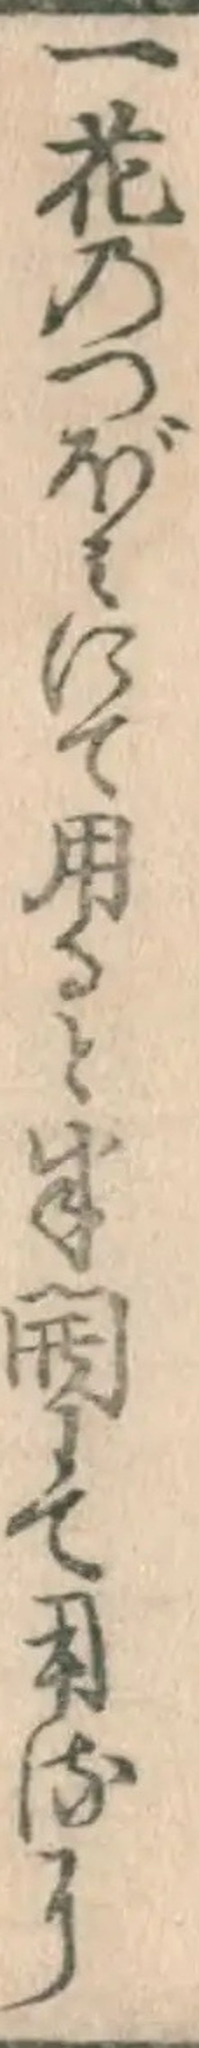一花のつぼみにて用ると半開にて用るに
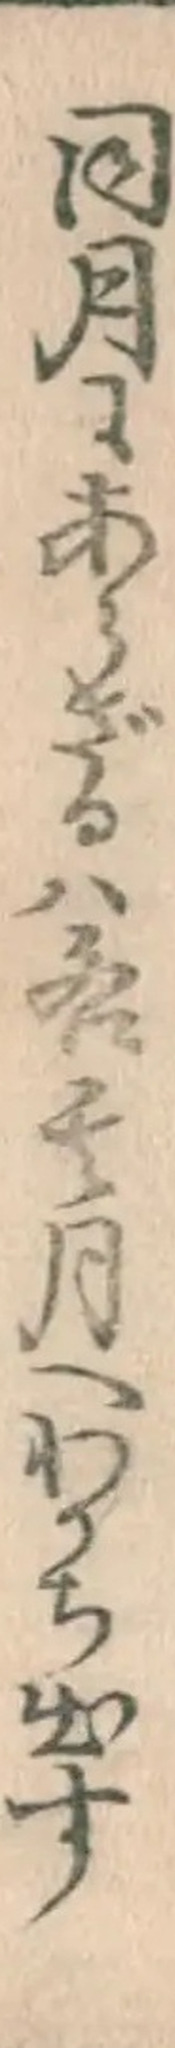同月にあらざるは各其月へわかち出す
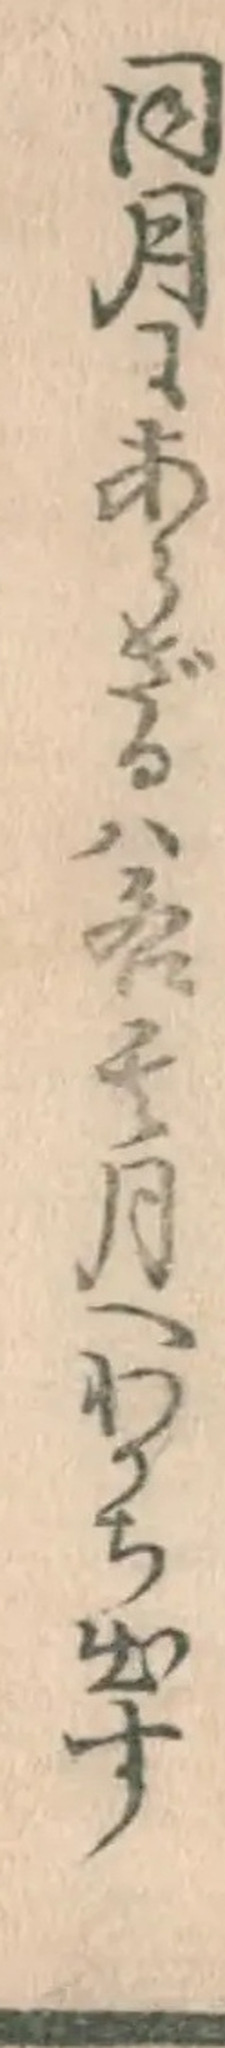同月にあらざるは各其月へわかち出す
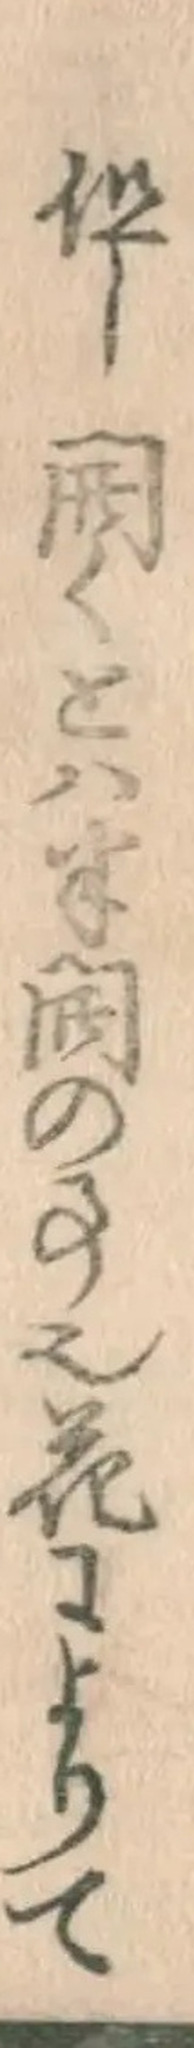但し開くとは半開の事也花によりて
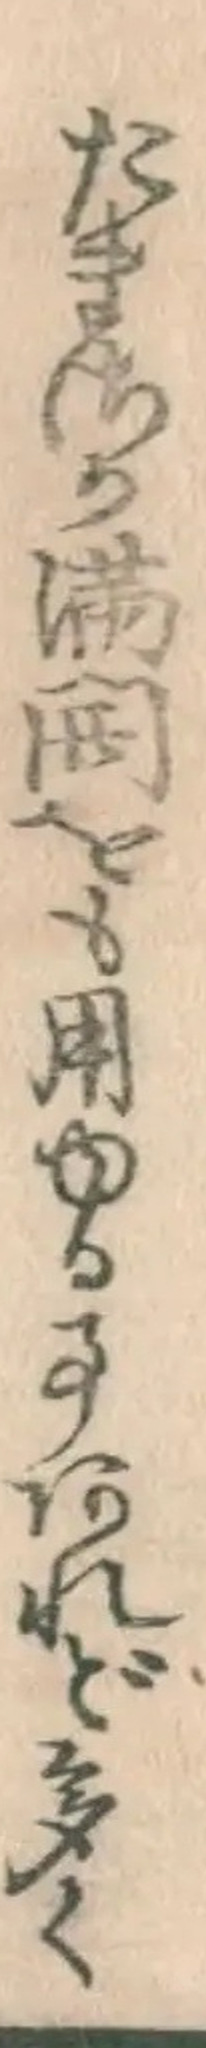たまさか満開をも用ゆる事あれど多く
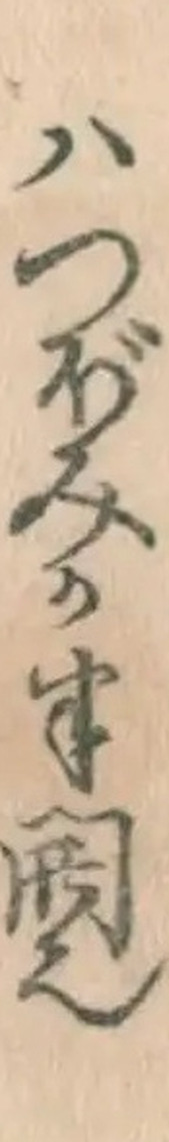はつぼみか半開也
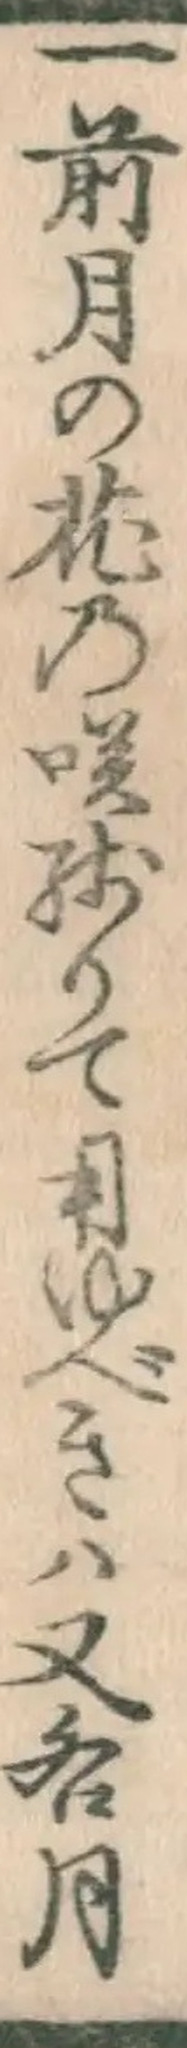一前月の花の咲残りて用ゆべきは又各月
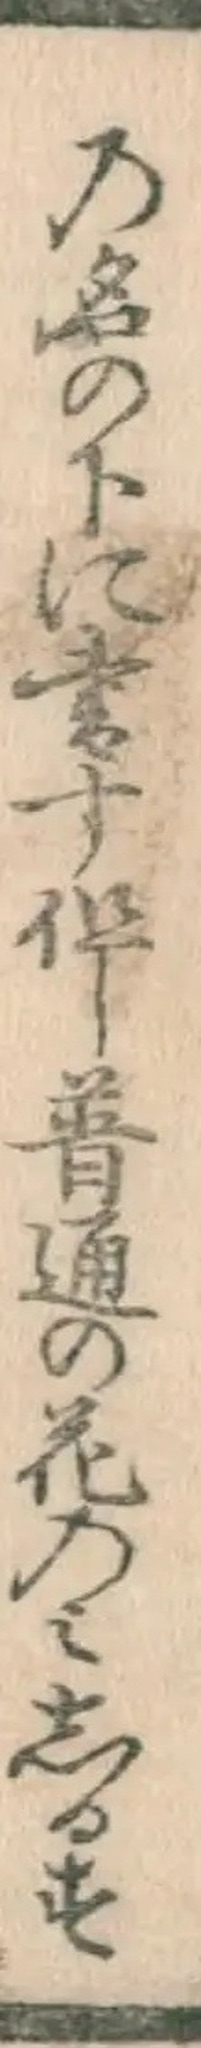の名の下に書す但し普通の花のみしるす
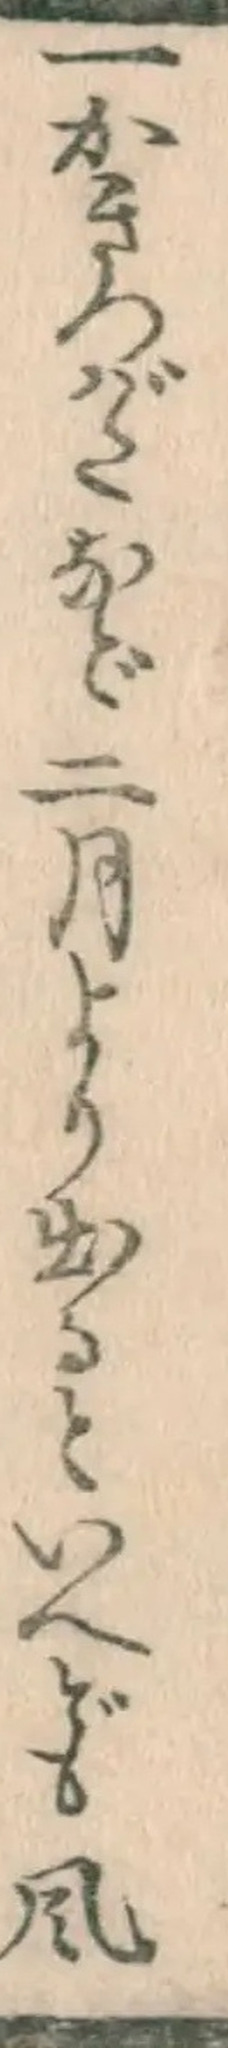一かきつばたなど二月より出るといへども風
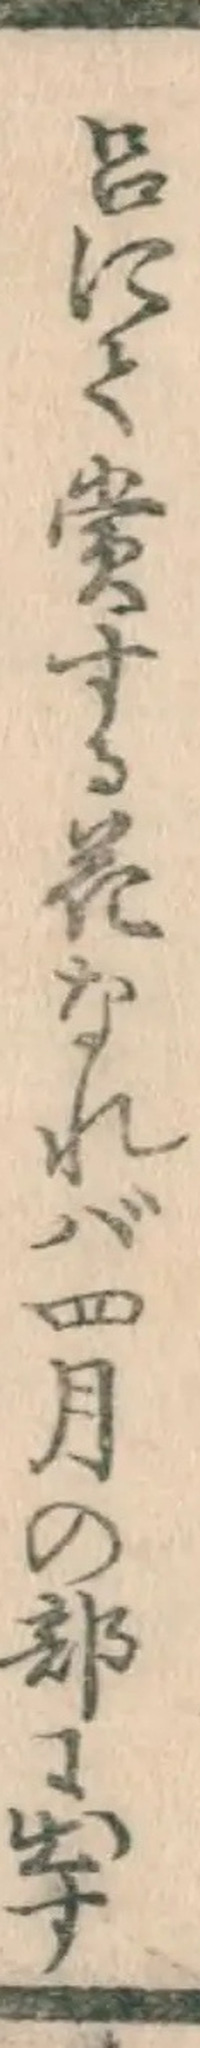呂にて賞する花なれば四月の部に出す
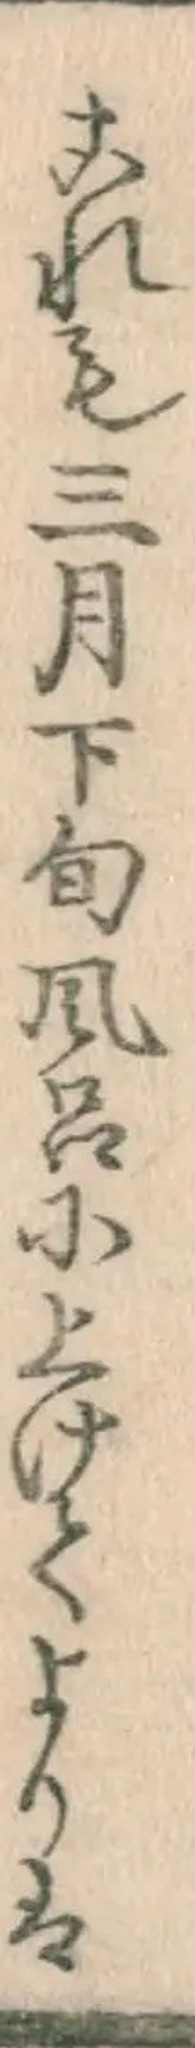これも三月下旬風呂に上けてよりは
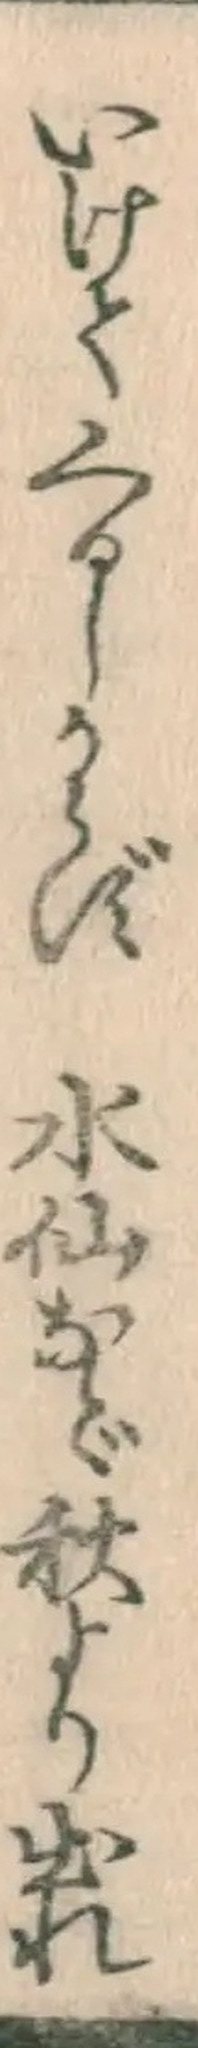いけてくるしからず水仙など秋より出れ
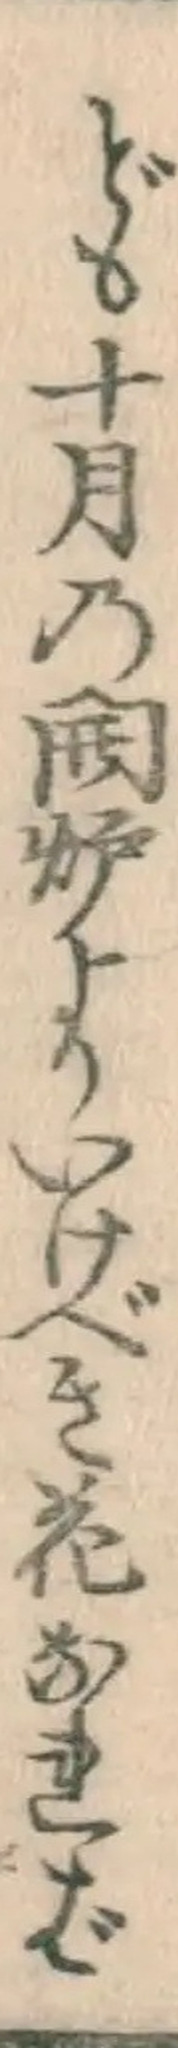ども十月の開路よりいけべき花なれば
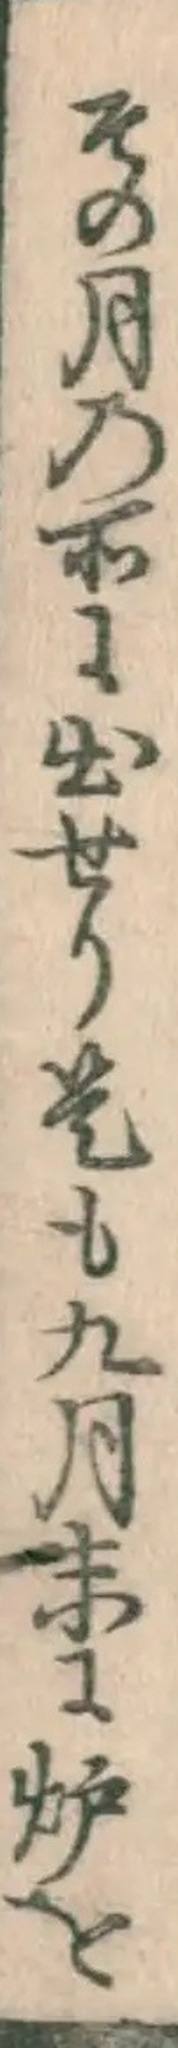その月の所に出せり是も九月末に炉を
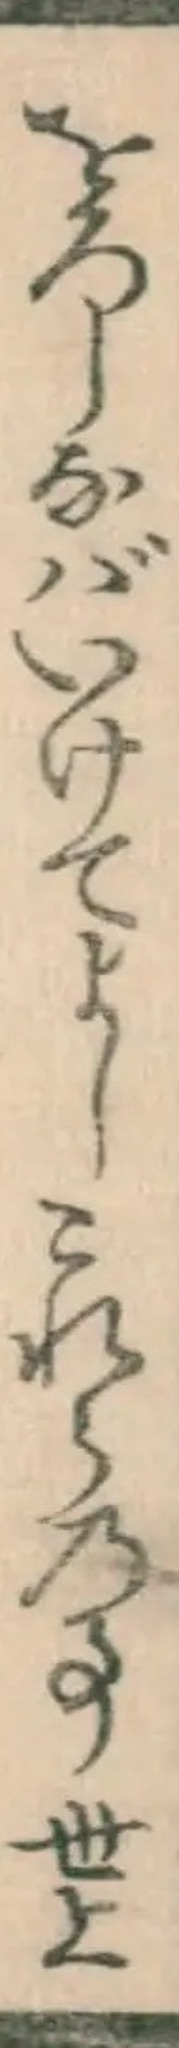をろしなばいけてよしこれらの事世上
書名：茶席挿花集
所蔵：国立国会図書館 National Diet Library, JAPAN
